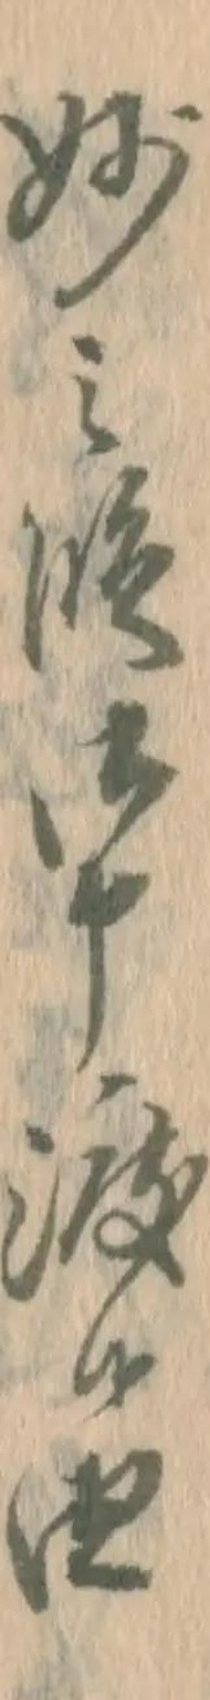妙之段御申渡候由
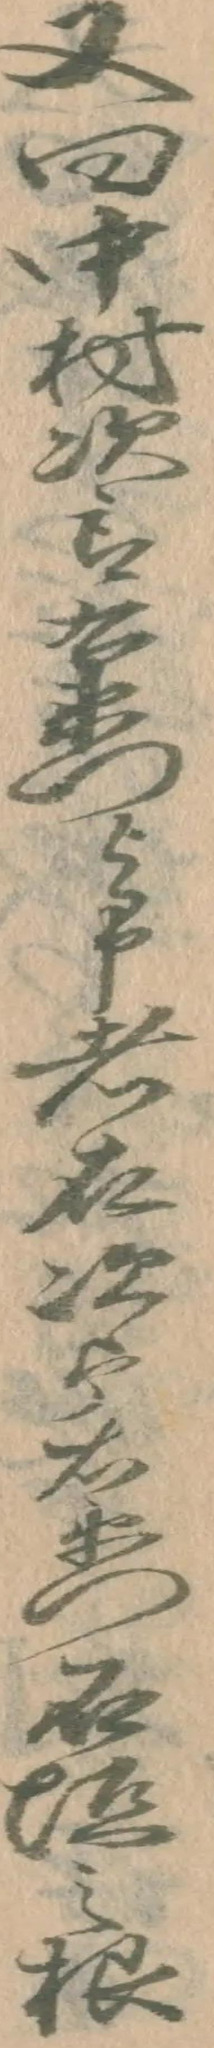又曰中村次郎右衛門与申者右次郎右衛門石垣之根
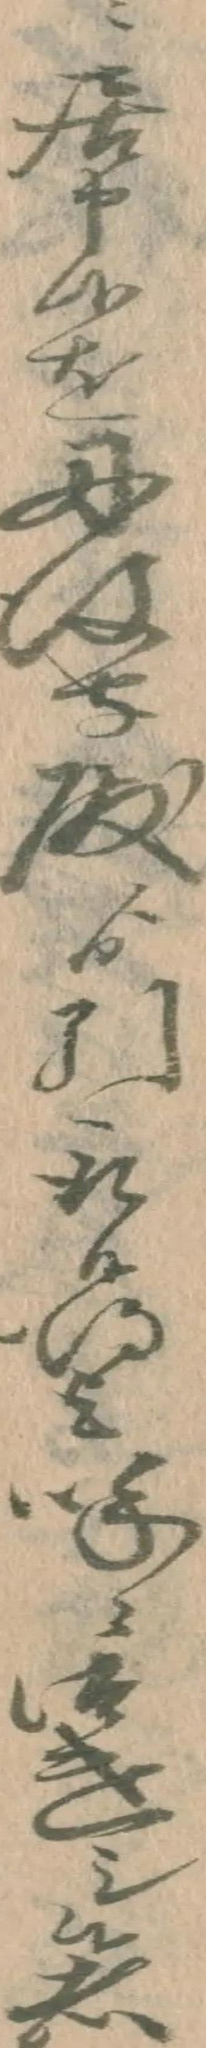に居申候を丹後守殿ゟ引取候得与呼に御遣し候者
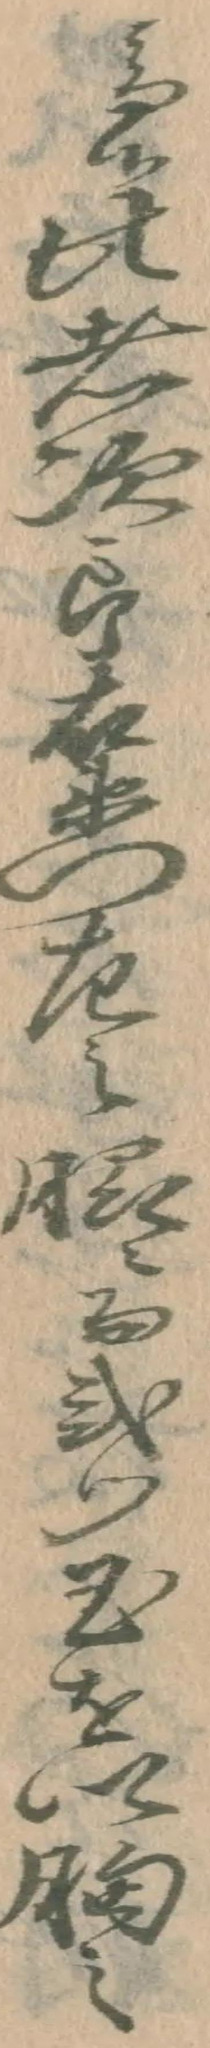に而此者次郎右衛門左之脇に而弐つ玉を以胸之
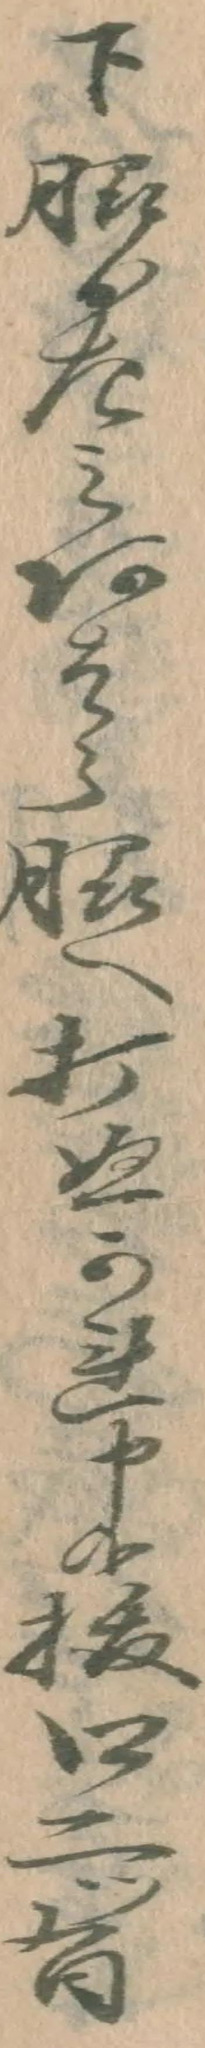下脇ゟ左之阿者ら脇へ打怒可連申候抜口二つ有
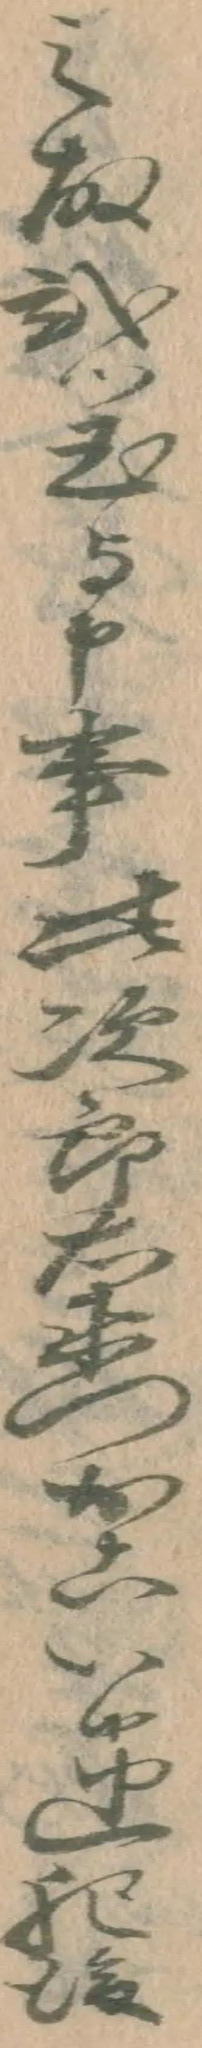之故弐つ玉与申事此次郎右衛門加古い候迚肥後
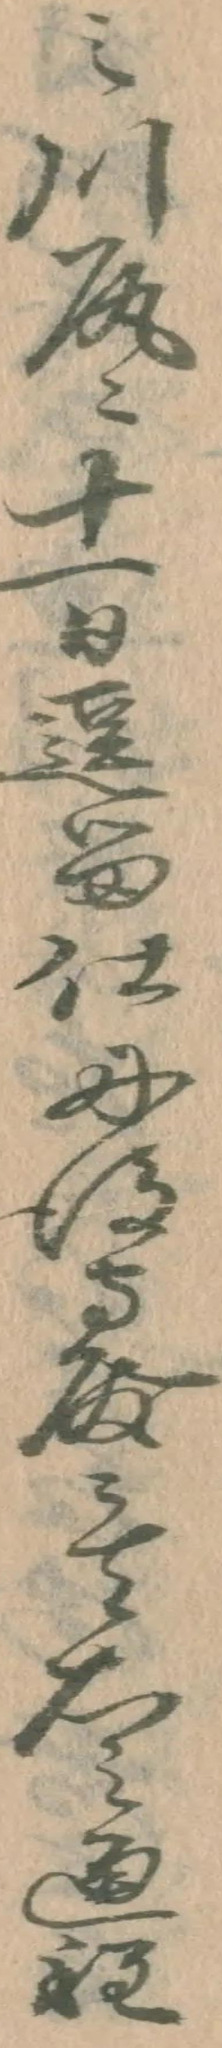之川尻に十一月逗留仕丹後守殿に者右之通程
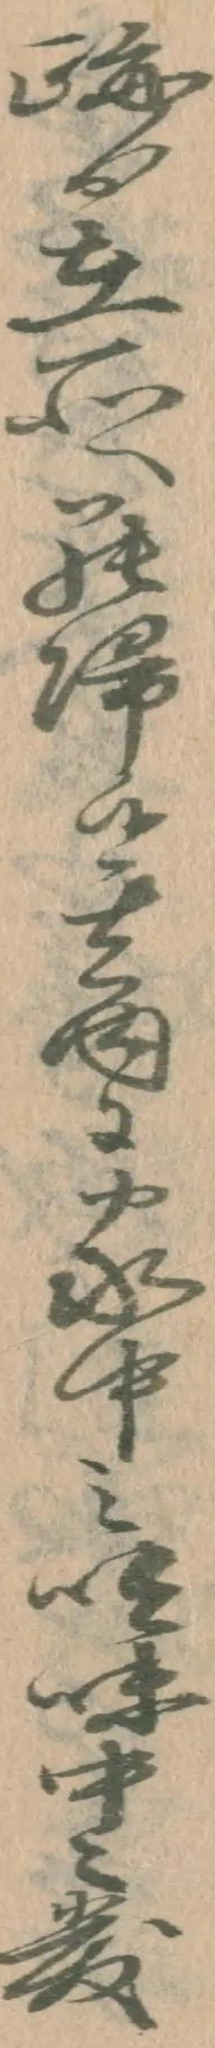跡ゟ在所へ罷帰候其内尓家中之吟味中々厳
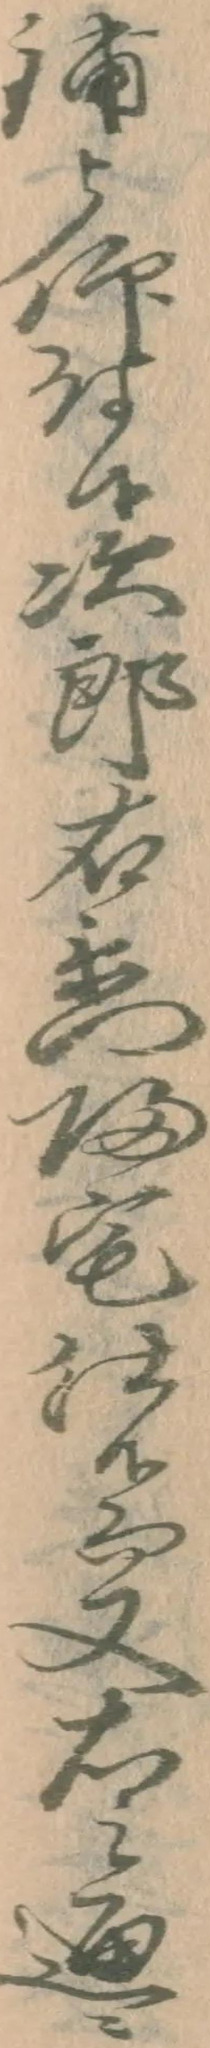鋪被仰付候次郎右衛門帰宅仕候而又右之通に
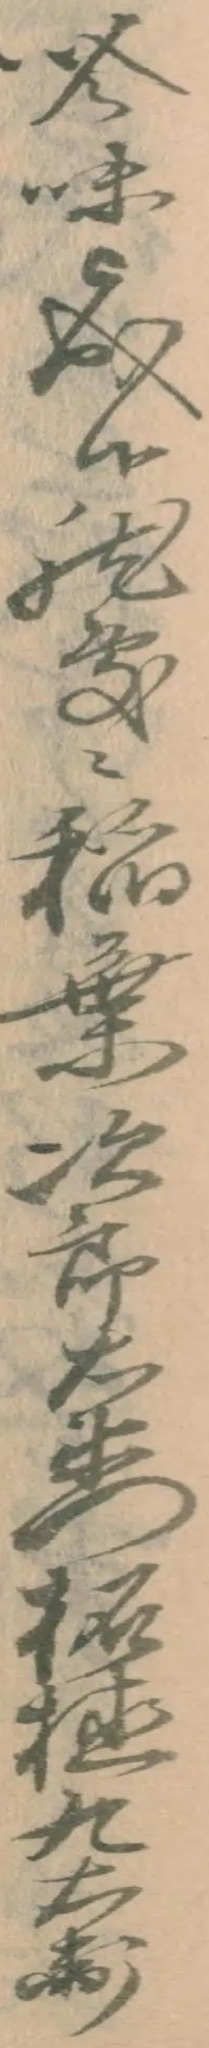吟味被成候然處に稲葉次郎右衛門柘植九右衛
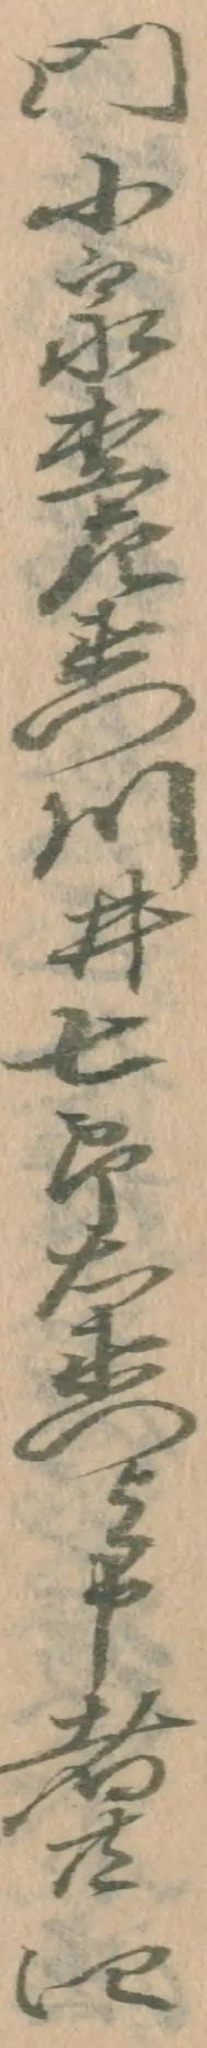門小泉杢左衛門川井七郎右衛門与申者共四
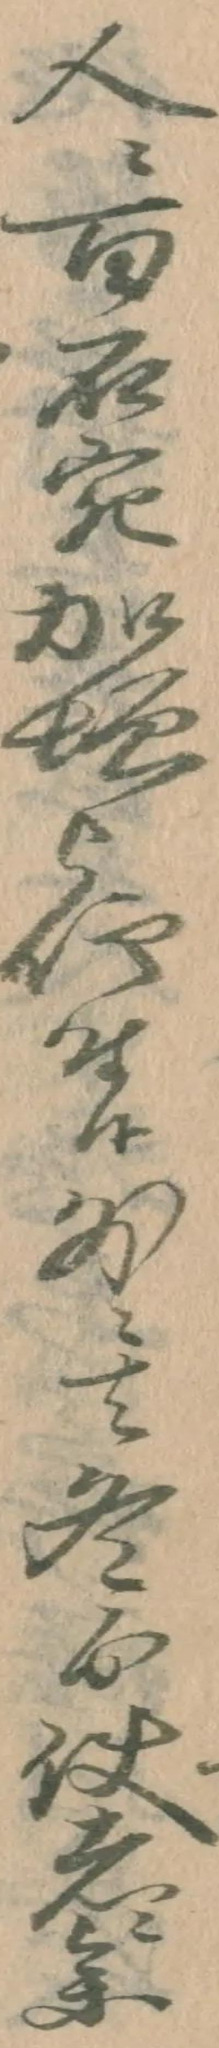人に百石宛加増被仰付候外に者冬ゟ使者に参
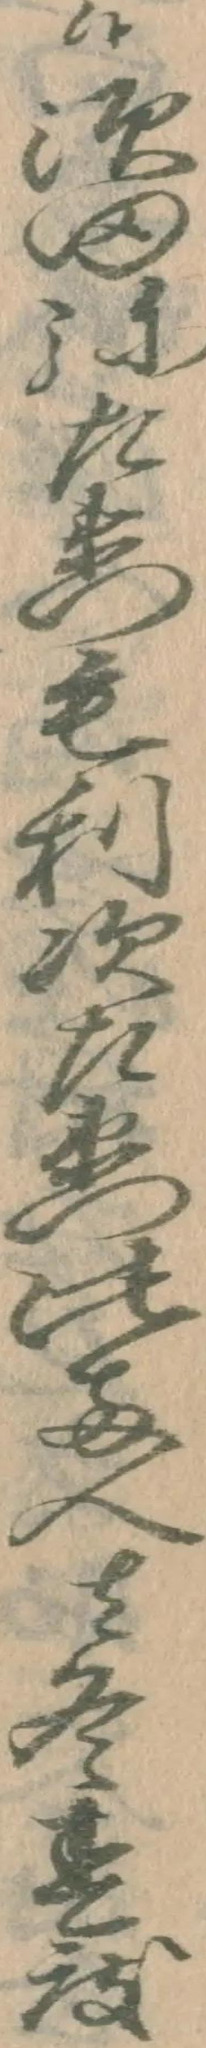候須田弥左衛門毛利次左衛門此両人者冬春度
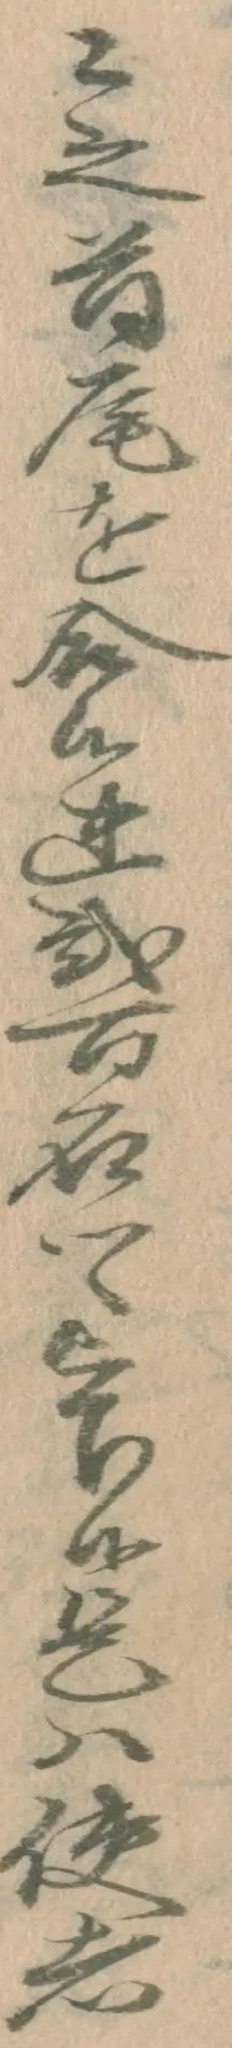々之首尾を合候迚弐百石つゝ被下候是は使者
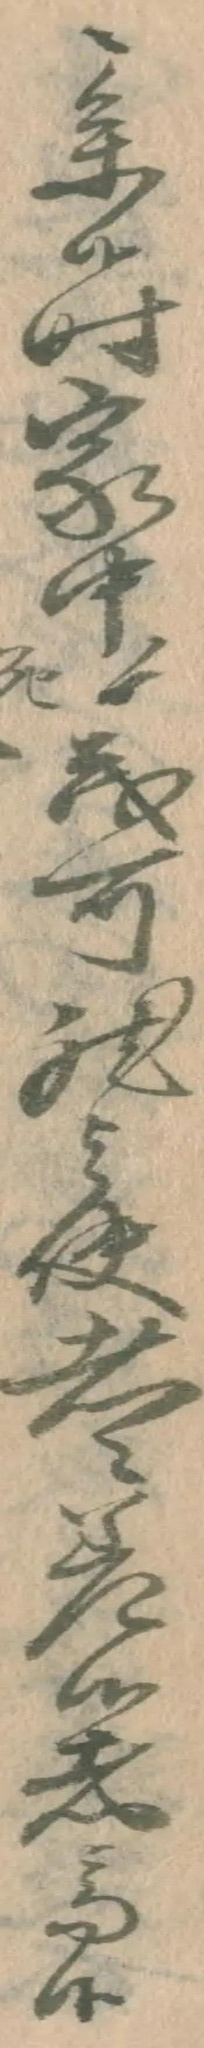に参候時家中ゟ茂可然与使者に差候者に而候
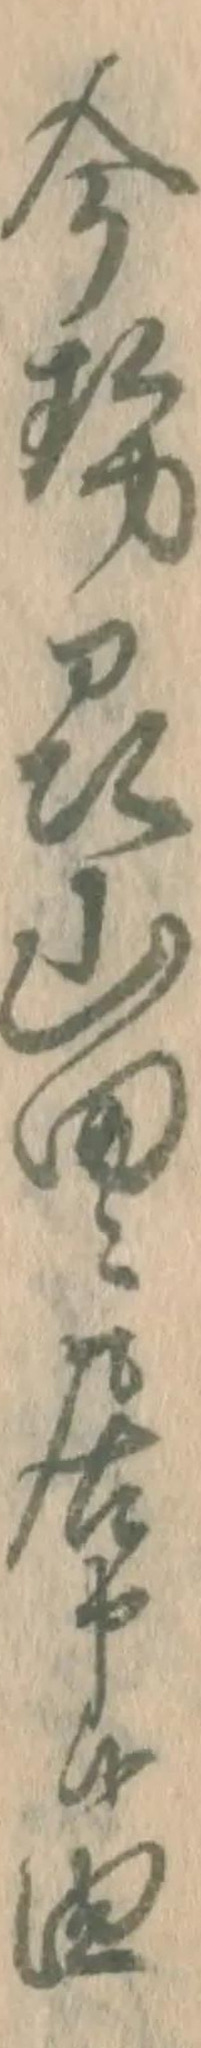今勢州山田に居申候由
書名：切支丹御退治記 49巻. [8]
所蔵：国立国会図書館 National Diet Library, JAPAN
